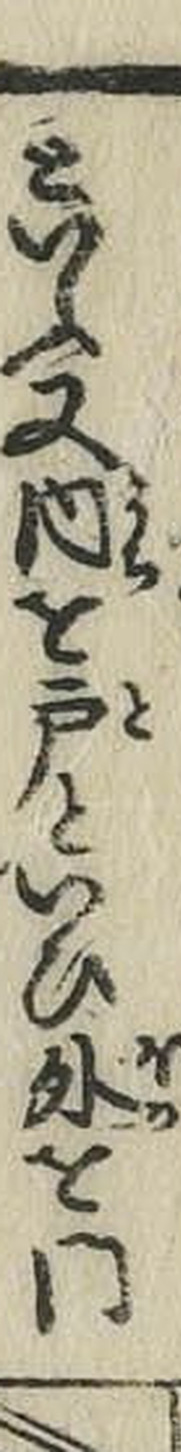といふ又内を戸といひ外を門
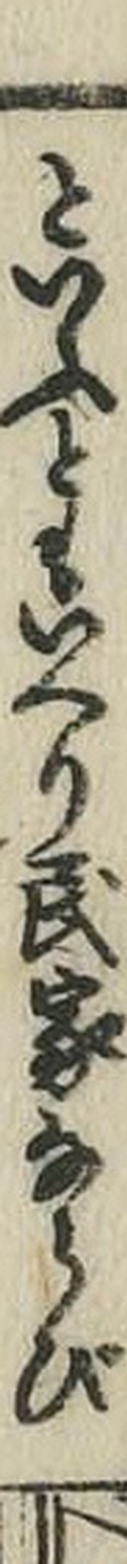といふともいへり民家ならび
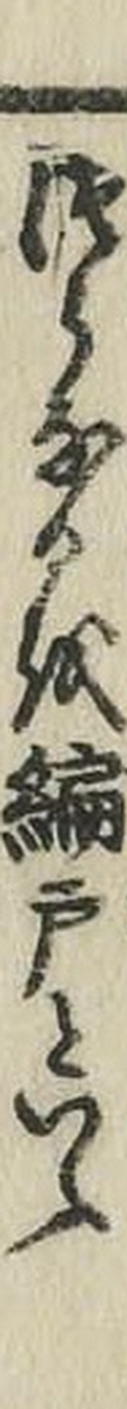つらなるを編戸といふ
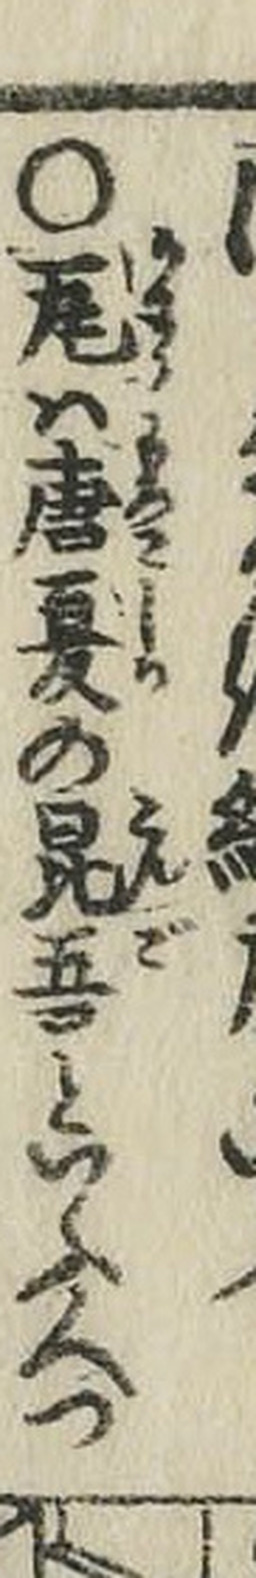○瓦は唐夏の昆吾といふ人つ
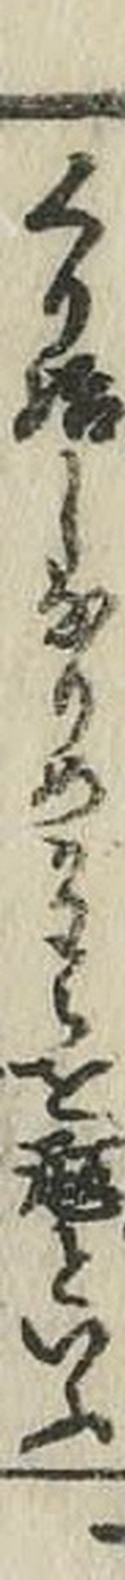くり始しなりめかわらを瓪といふ
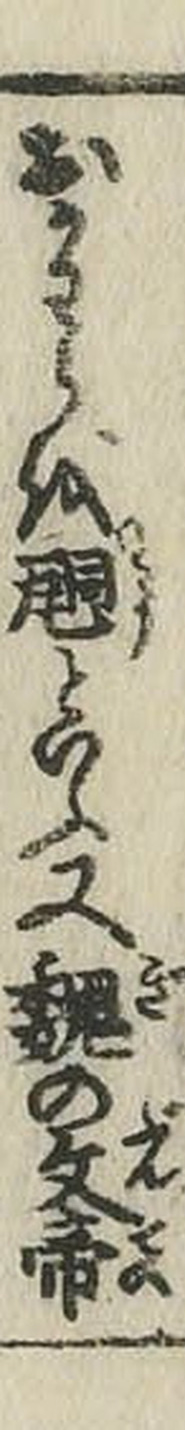おかわらを𤭆といふ又魏の文帝
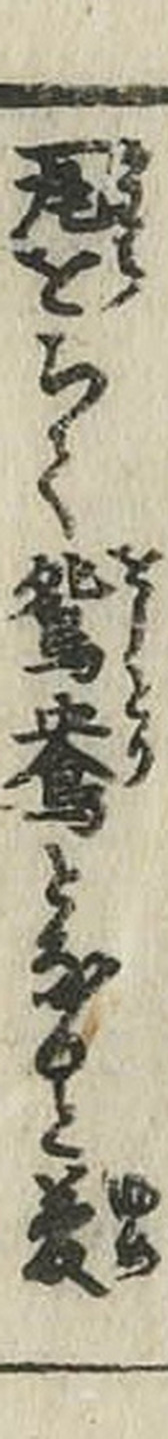瓦をちて鴛鴦となると夢
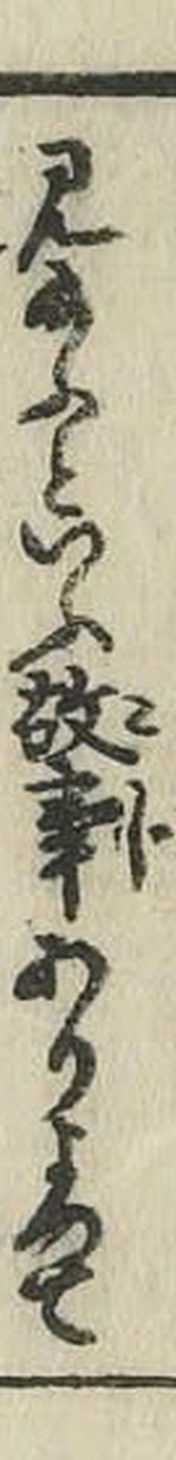見給ふといふ故事ありよつて
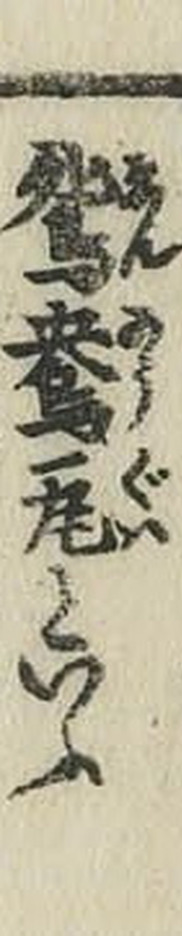鴛鴦瓦といふ
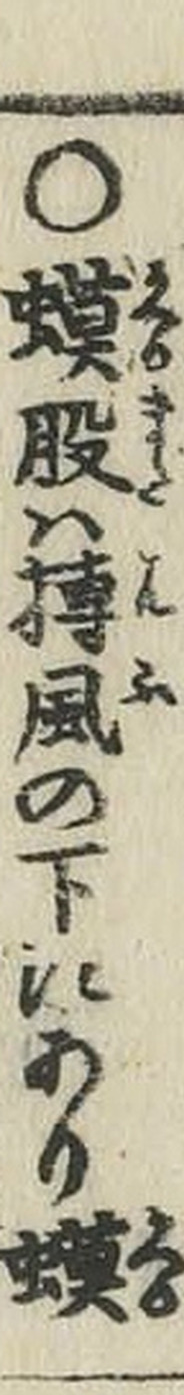○蟆股は摶風の下にあり蟆
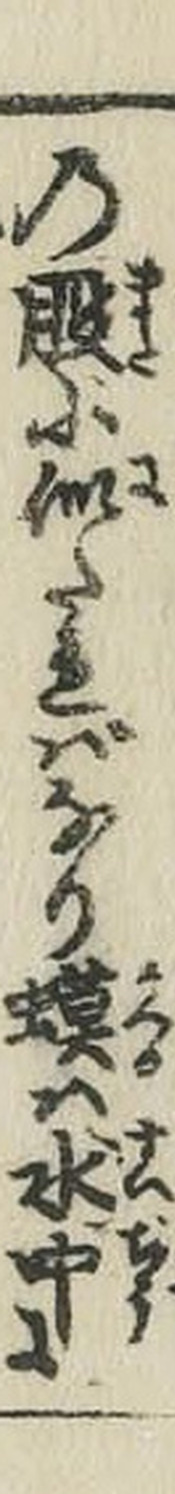の股に似たればなり蟆は水中に
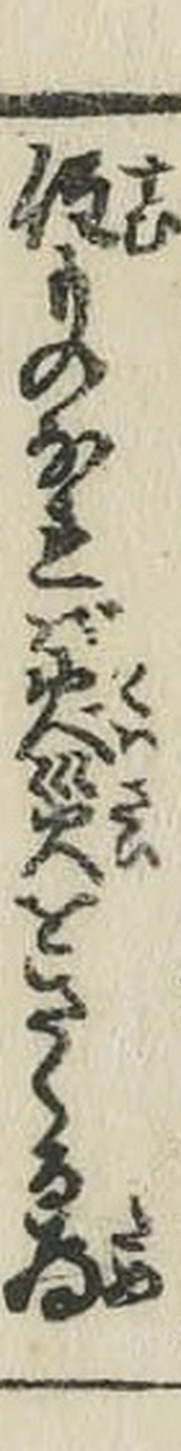住ものなれば火災をさくる為
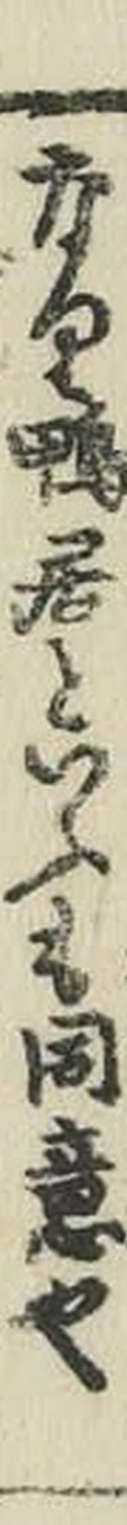なり鴨居といふも同意也
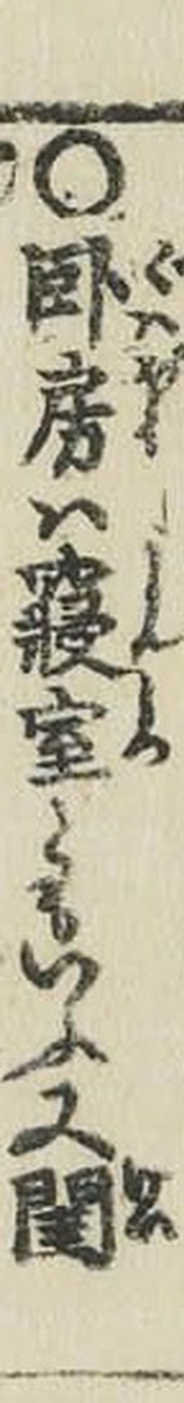○臥房は寝室ともいふ又閨
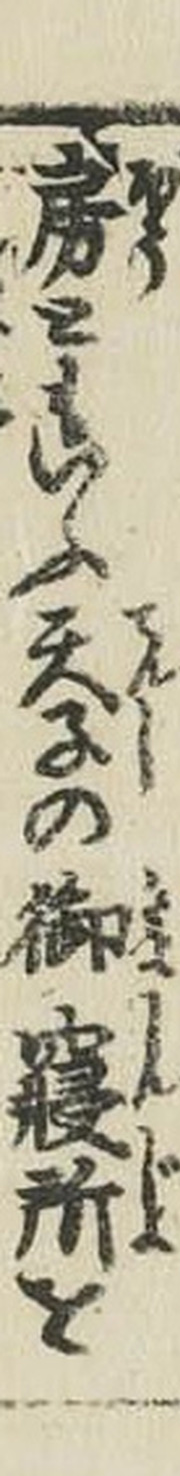房ともいふ天子の御寝所を
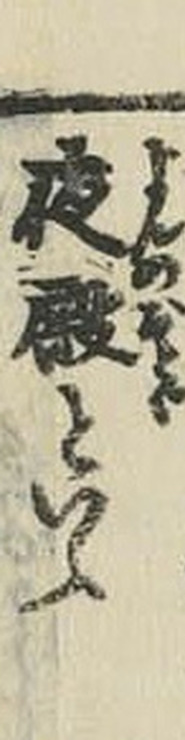夜殿といふ
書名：増補頭書訓蒙図彙大成 10巻 2:巻之1-3
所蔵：東京学芸大学教育コンテンツアーカイブ
